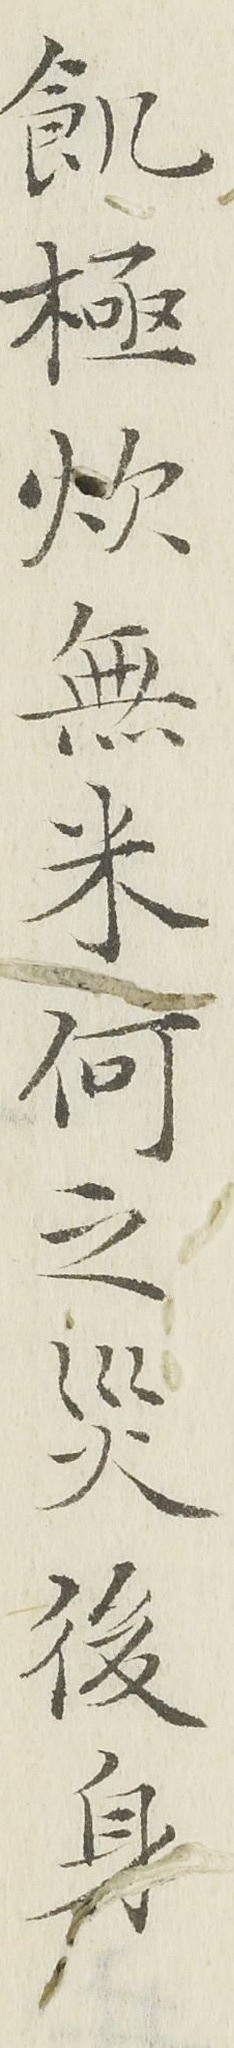飢極炊無米何之災後身

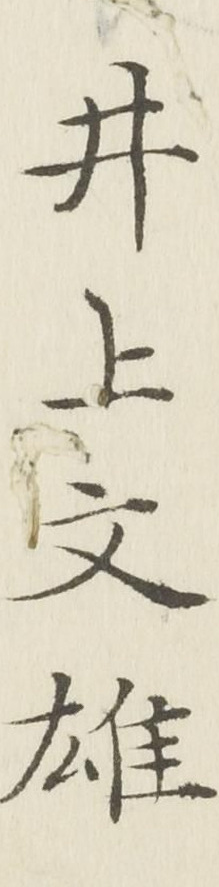井上文雄
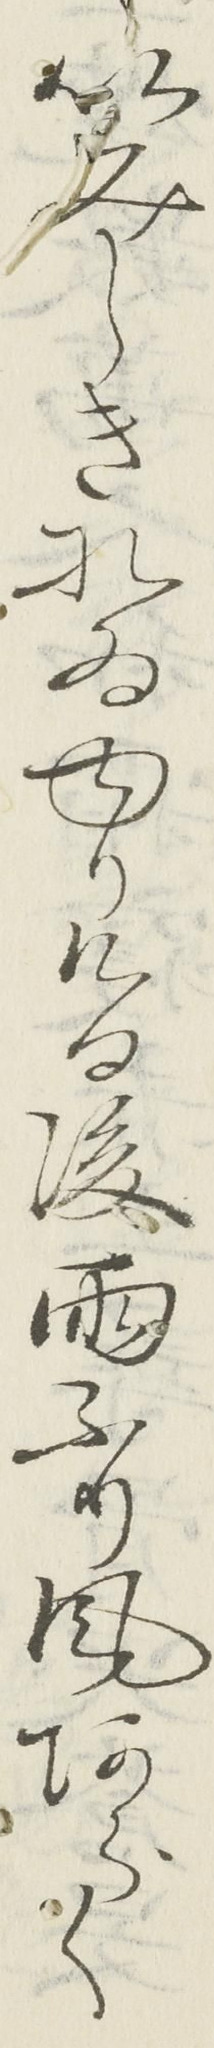いみしきなゐゆりける後雨ふり風あらく
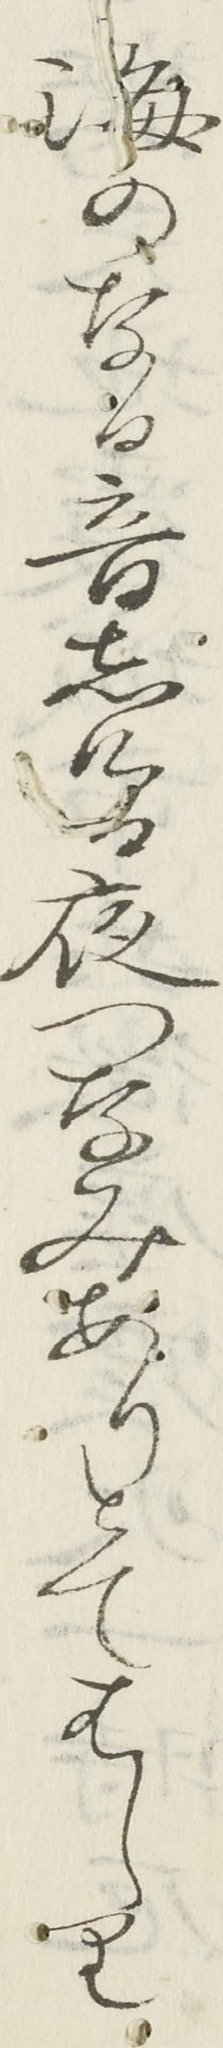海のなる音しける夜つなみありとてはしり
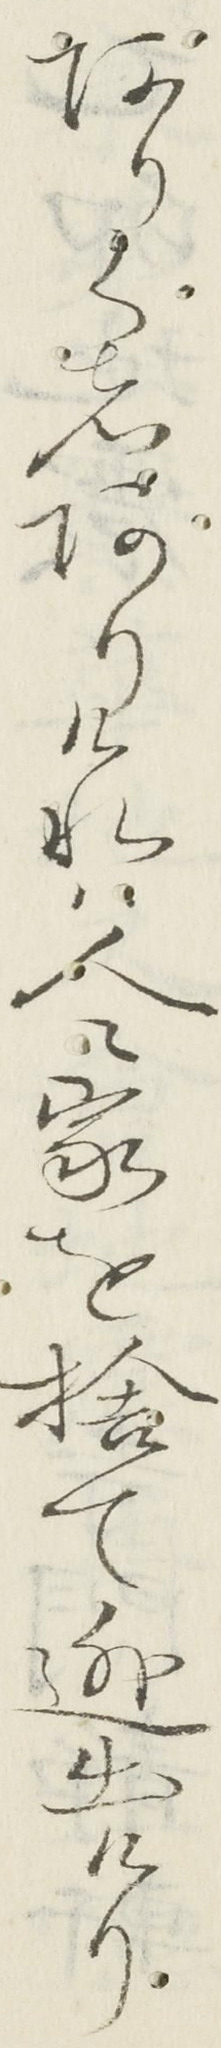ありく者ありけれハ人々家を捨て迯出けり
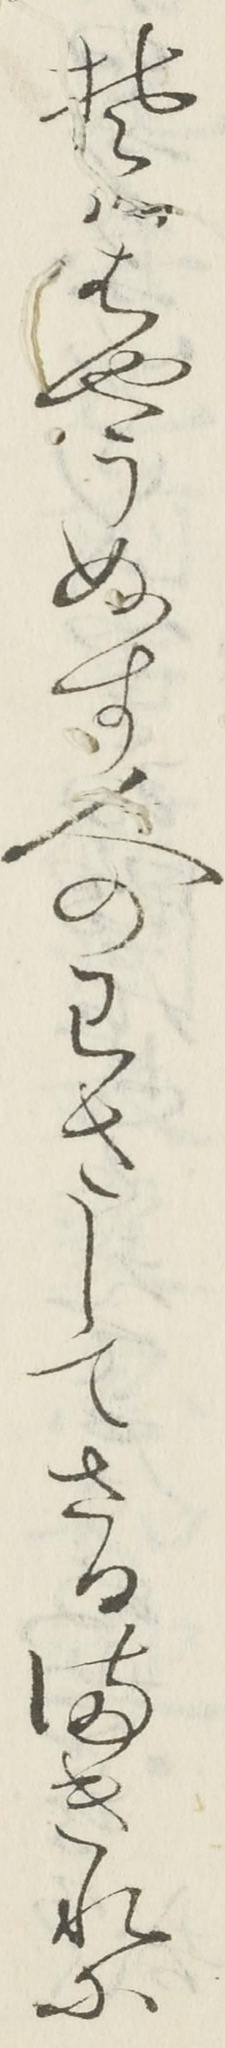そはやうぬす人のわさしてさるまきれに
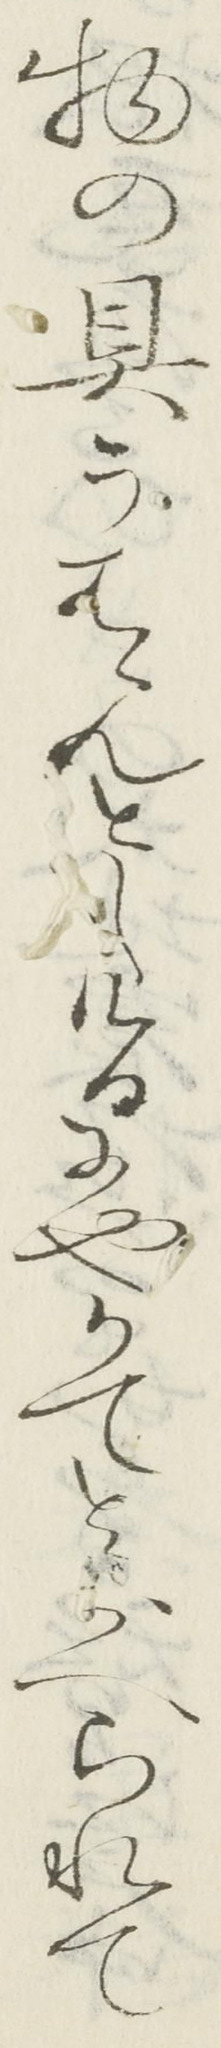物の具うはゝんとしけるにやりてとらへられて
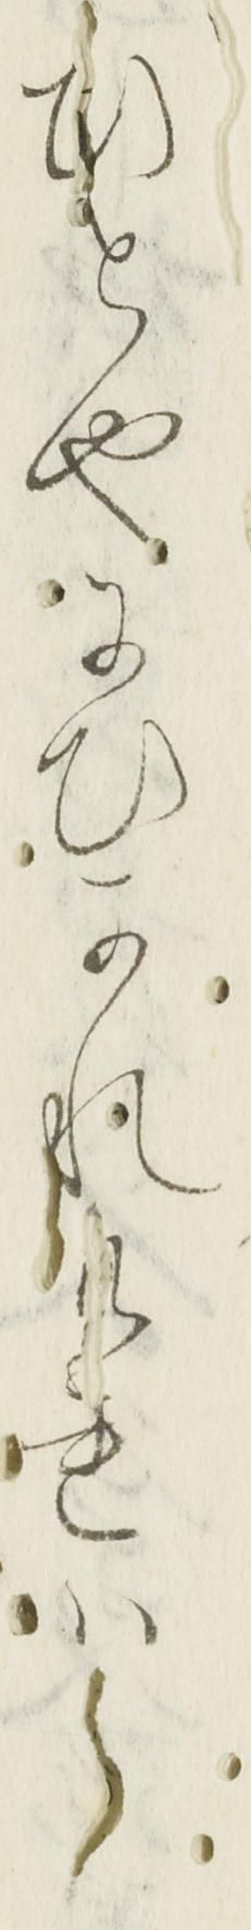ひとやにひかれけれハ
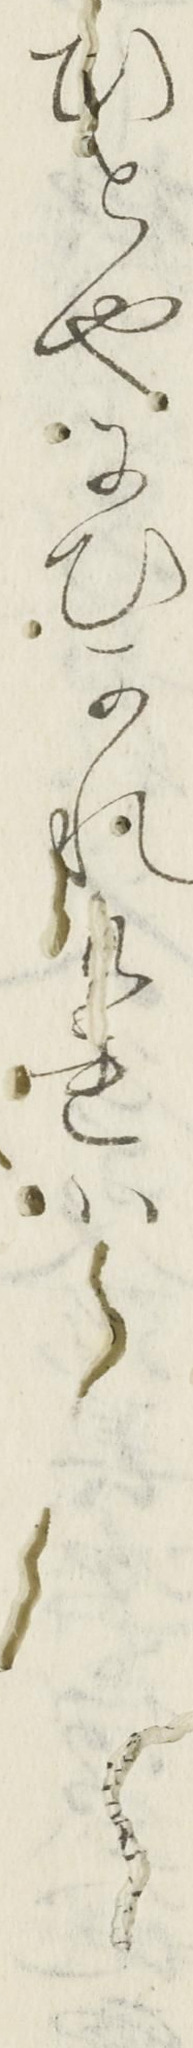ひとやにひかれけれハ
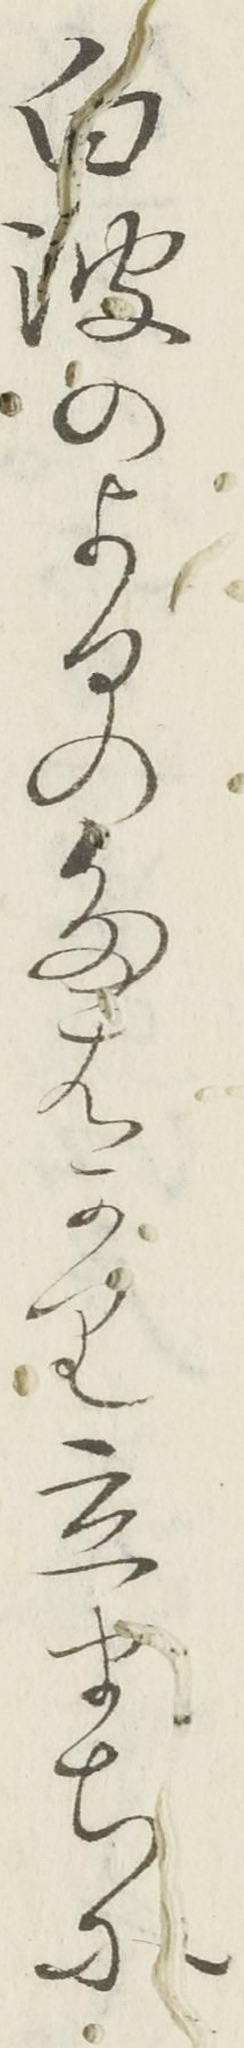白波のよるのたはかり立まちに
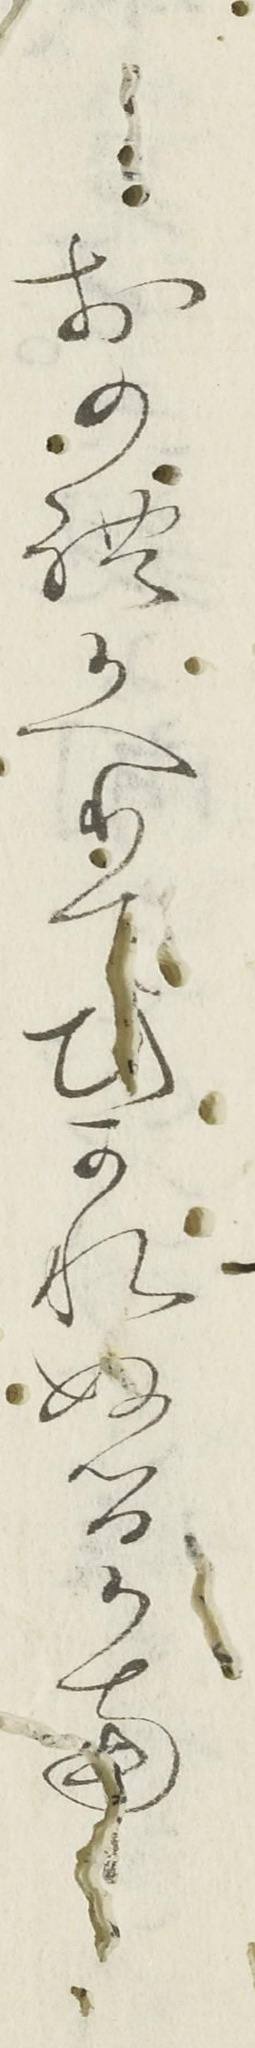おのれかへりてひかれぬるか南
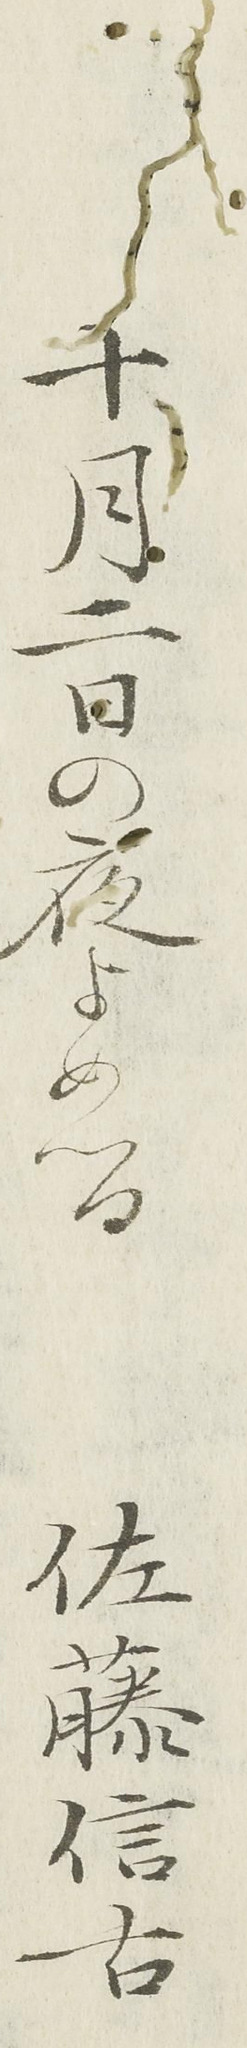十月二日の夜よめる佐藤信右
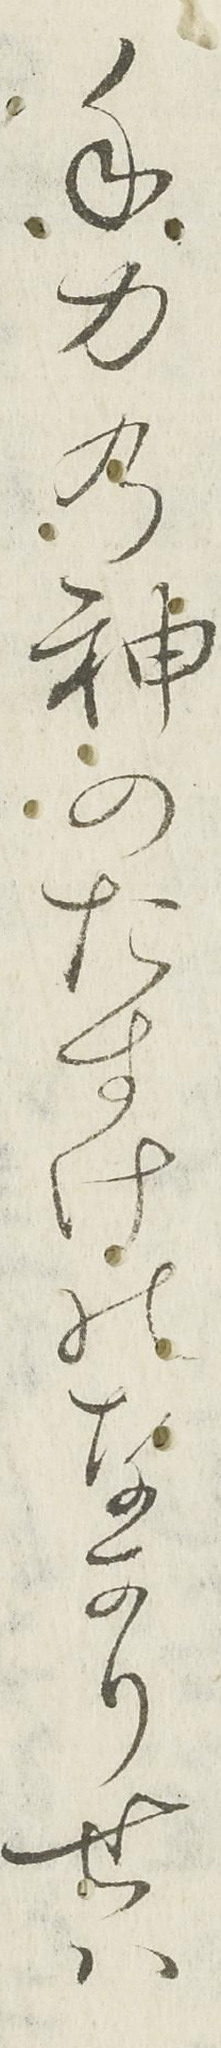手力の神のたすけのなかりせハ
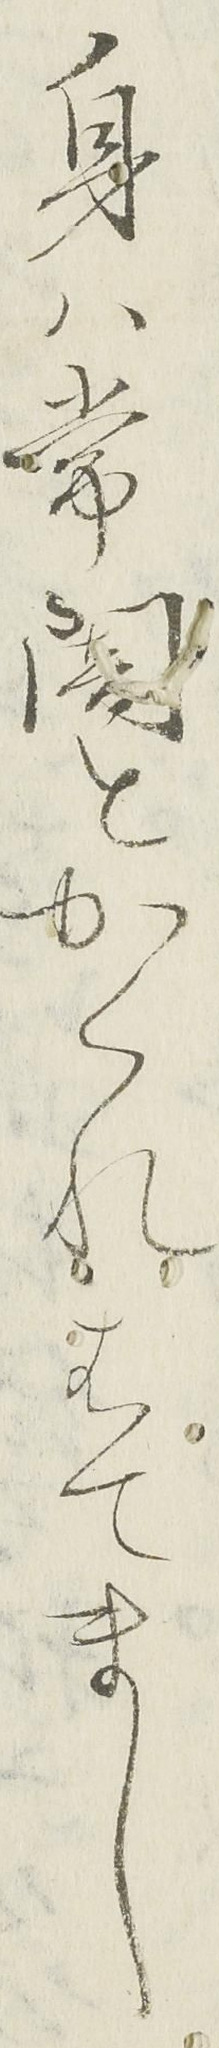身ハ常闇とかくれはてまし

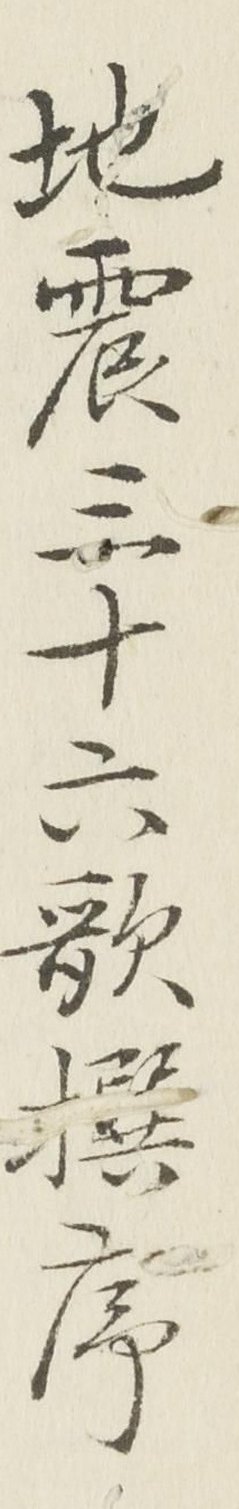地震三十六歌撰序
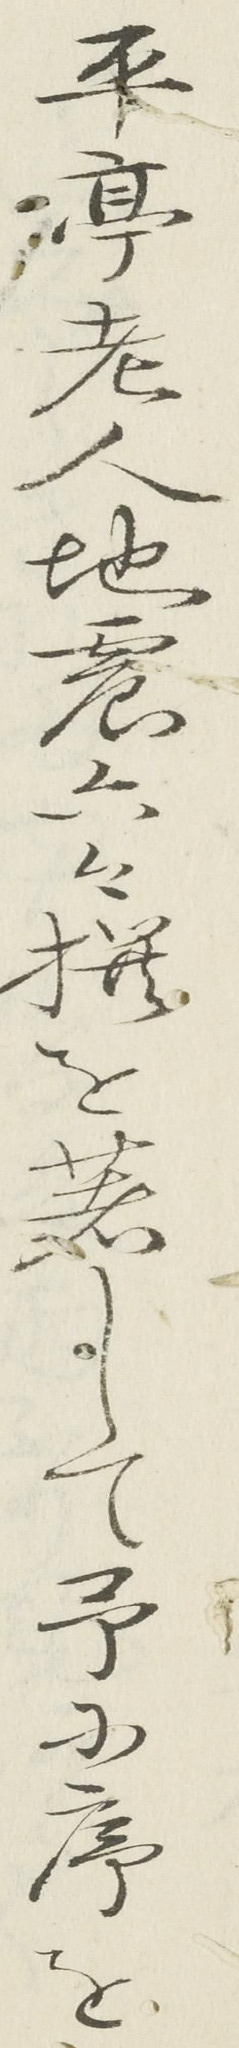平亭老人地震六々撰を著して予に序を
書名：地震考證　全
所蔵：東京大学地震研究所図書室 Earthquake Research Institute Library, The University of Tokyo, JAPAN
